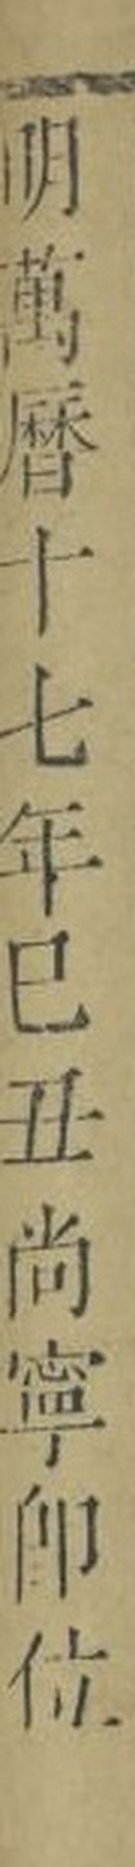明万暦十七年巳丑尚寧即位
